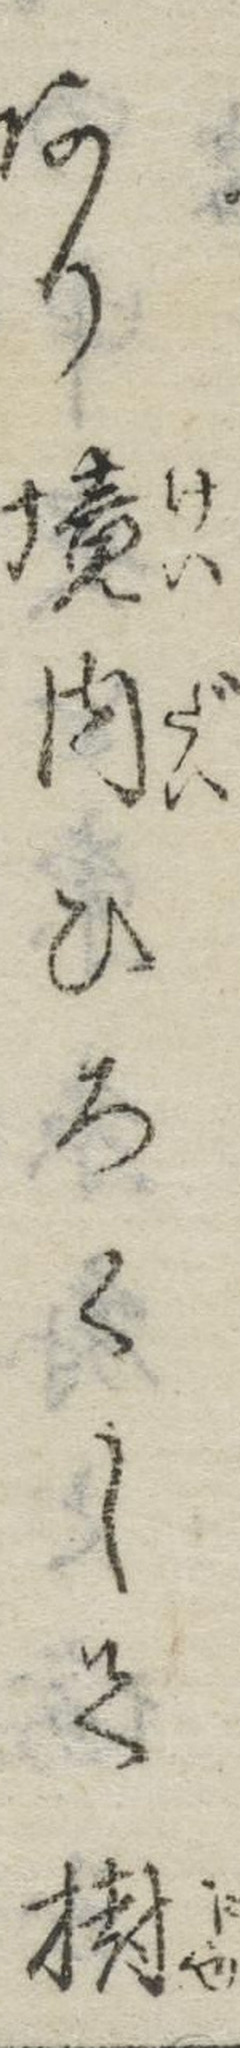あり境内ひろくして樹
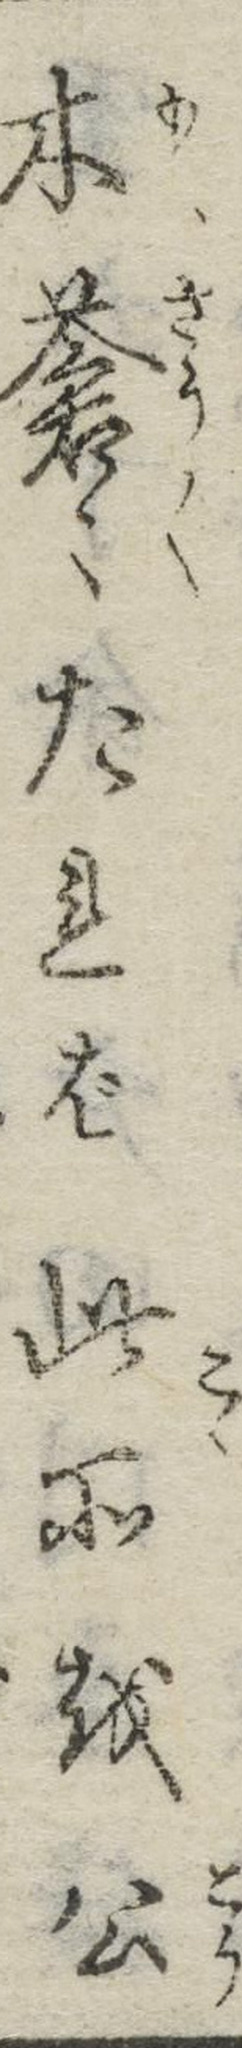木蒼々たれば此所を公
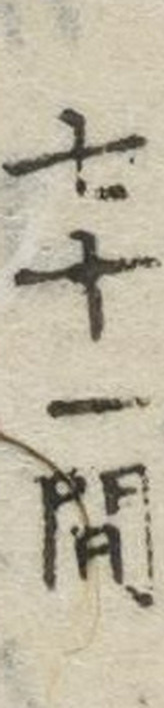七十一間
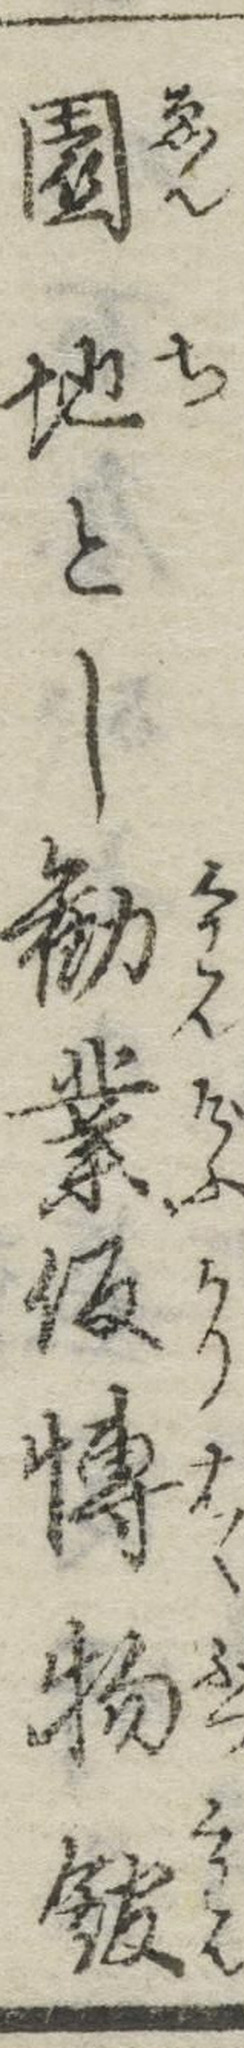園地とし勧業仮博物館
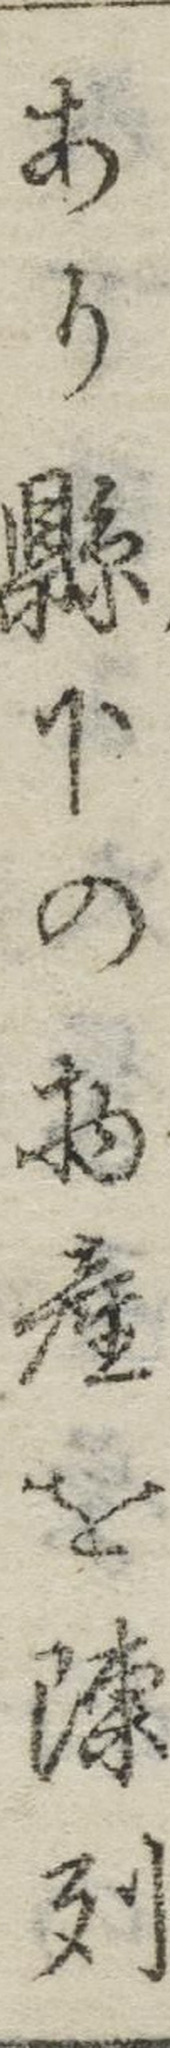あり縣下の物産を陳列
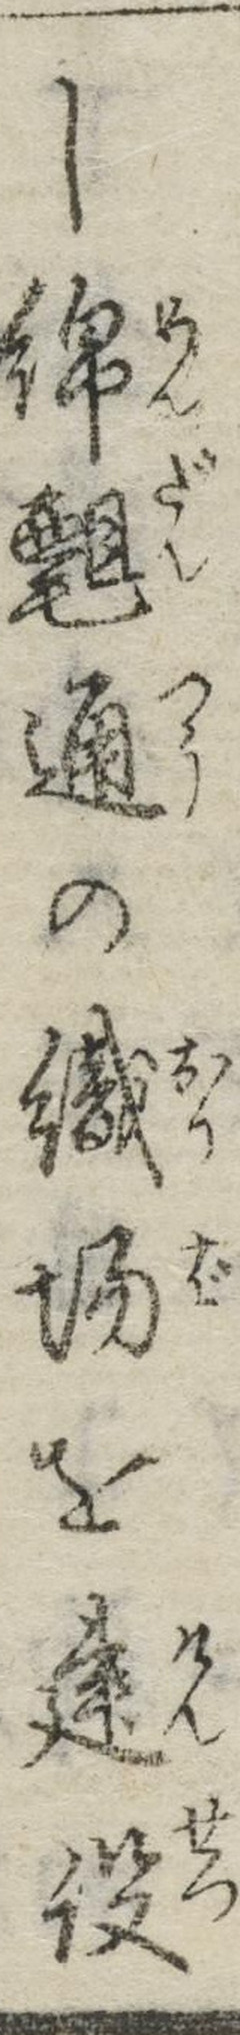し綿緞？通の織場を建設
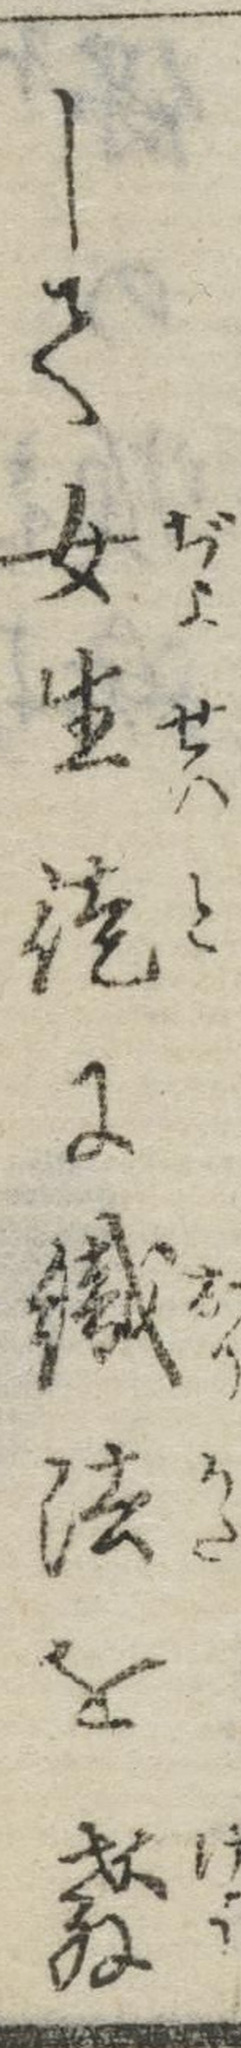して女生徒に織法を教
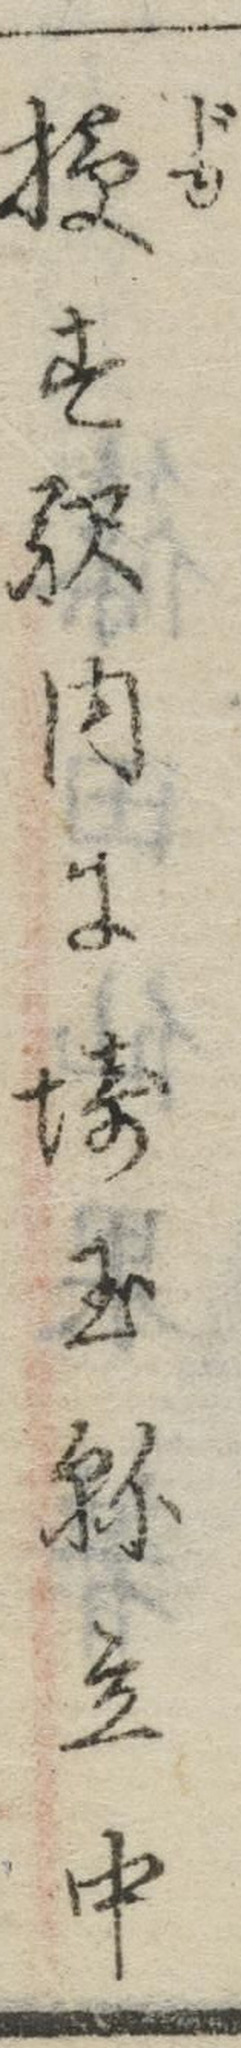授す駅内に埼玉縣立中
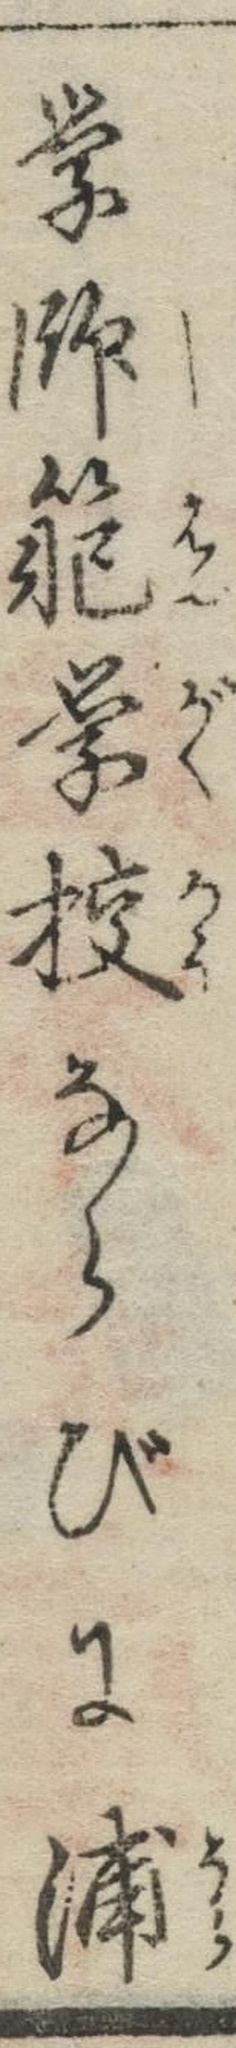学師範学校ならびに浦
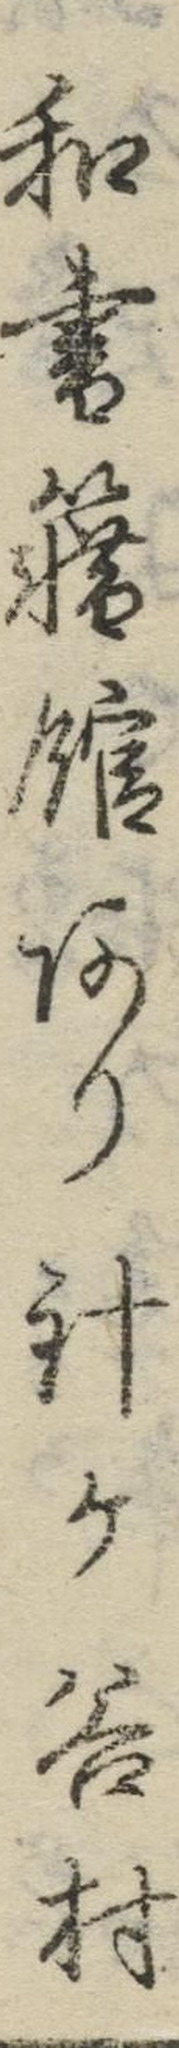和書籍館あり針ヶ谷村
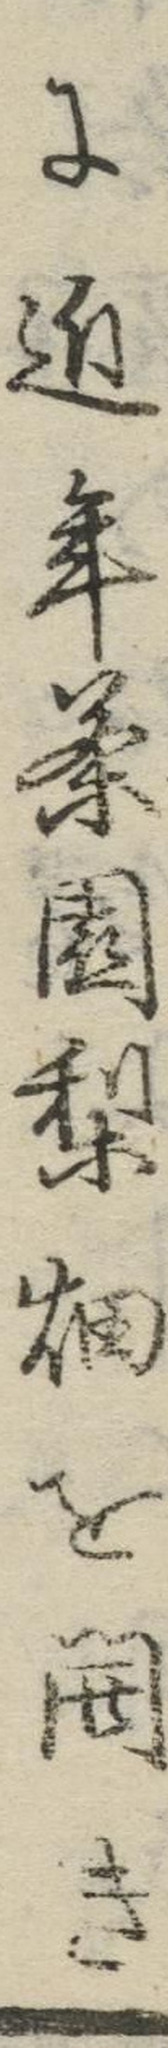に近年茶園梨畑を開き
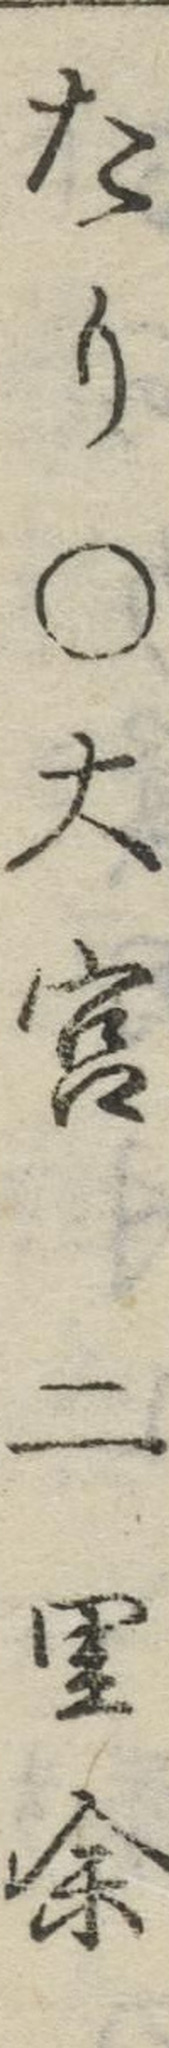たり○大宮二里余
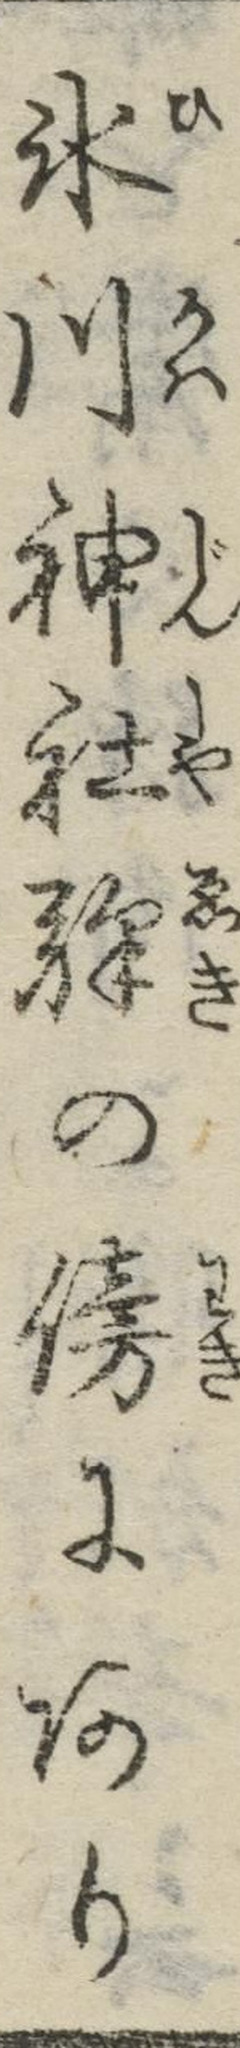氷川神社驛の傍にあり
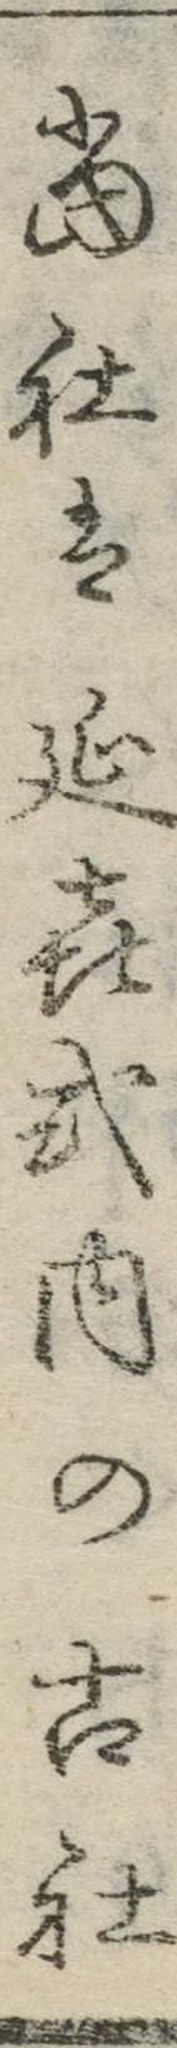当社は延喜式内の古社
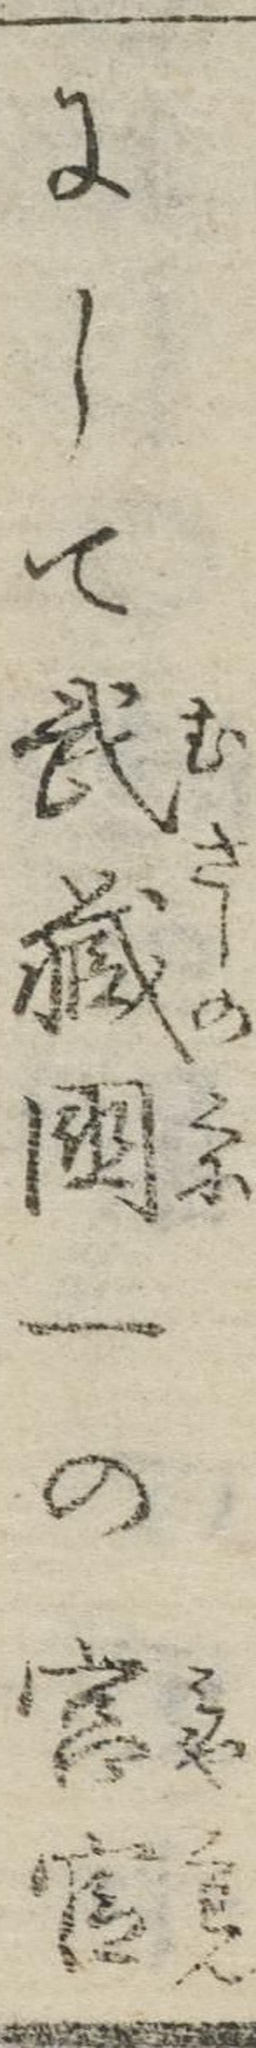にして武蔵國一の宮官
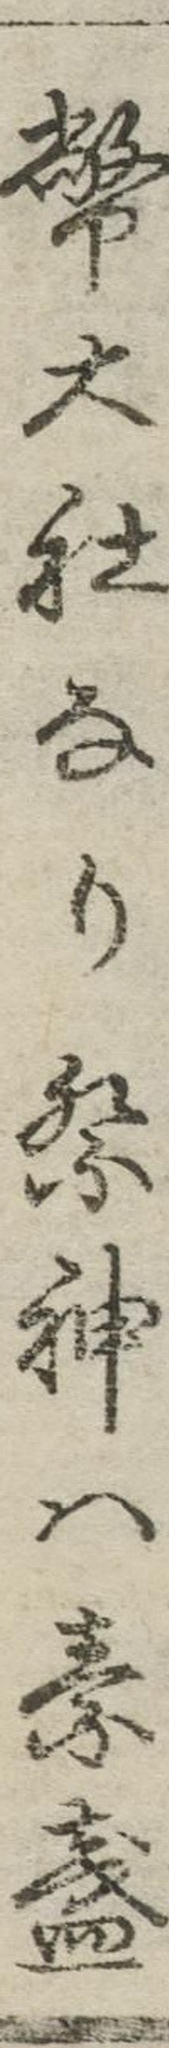幣大社なり祭神は素盞
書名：上州伊香保鑛泉圖會　全
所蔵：東京大学地震研究所図書室 Earthquake Research Institute Library, The University of Tokyo, JAPAN
